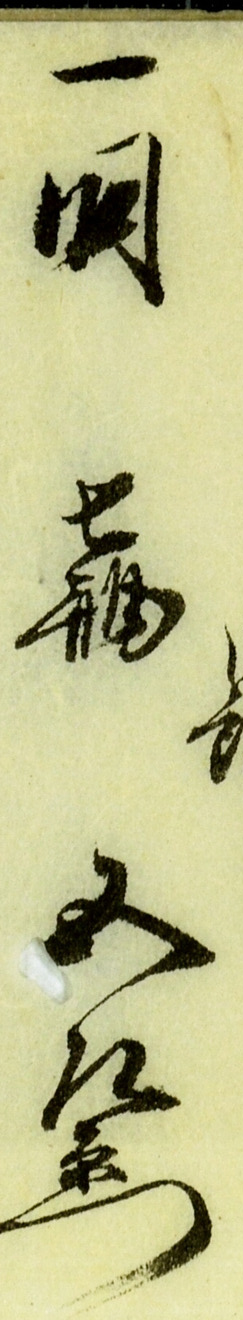一同七瓶五左衛門
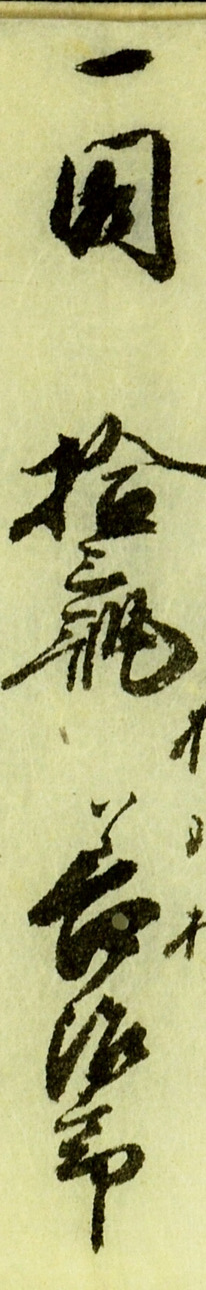一同拾三瓶善治郎
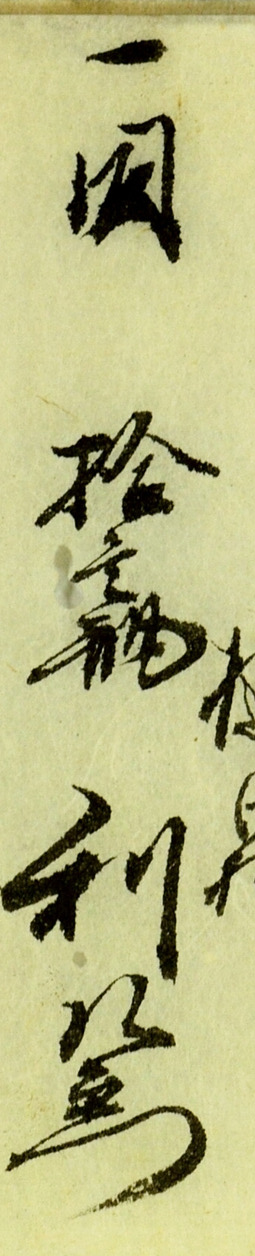一同拾壱瓶利左衛門
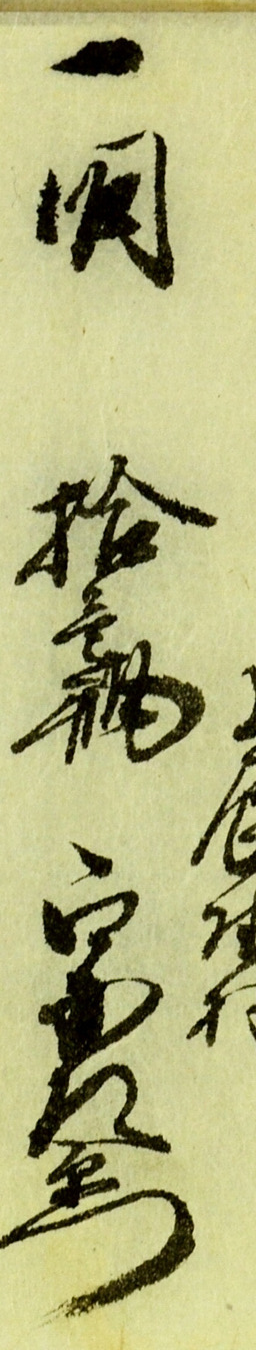一同拾壱瓶利左衛門
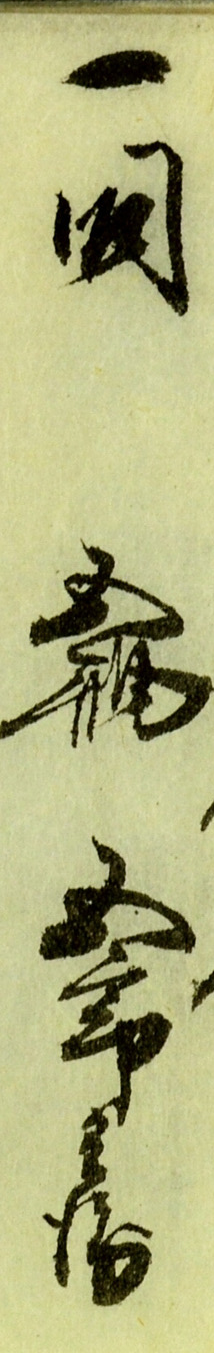一同五瓶五郎兵衛

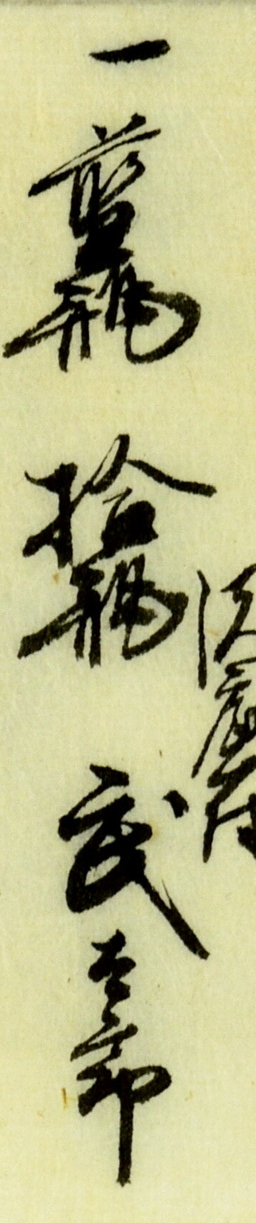一藍瓶拾瓶武太郎
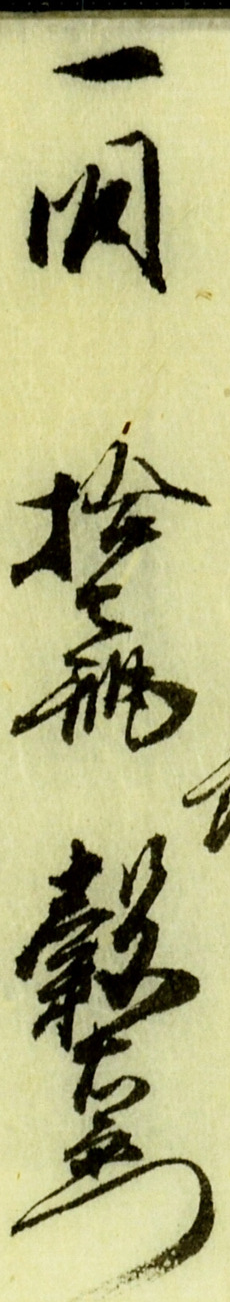一同拾七瓶穀右衛門
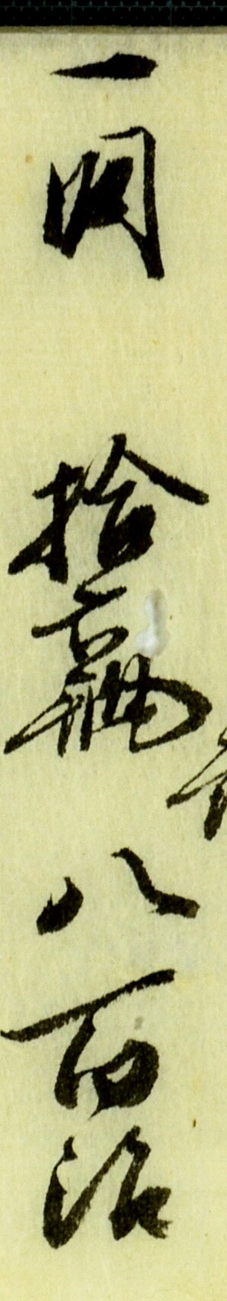一同拾六瓶八百治
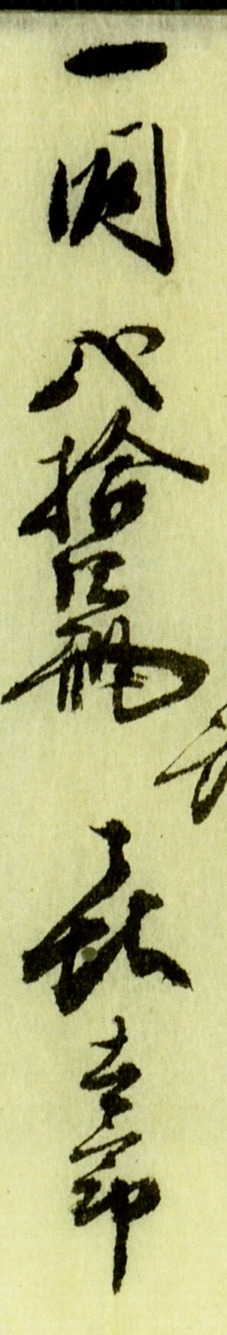一同弐拾四瓶喜太郎
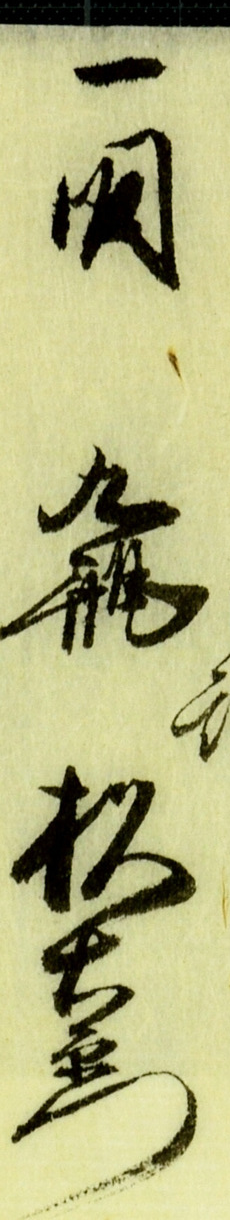一同九瓶杉右衛門
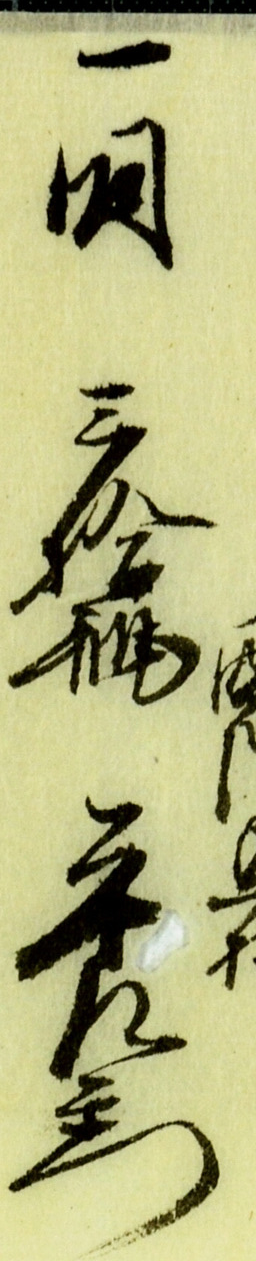一同三拾瓶平左衛門
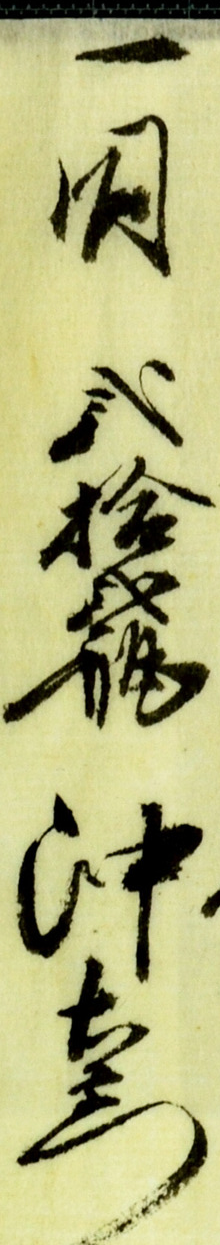一同弐拾弐瓶沖右衛門
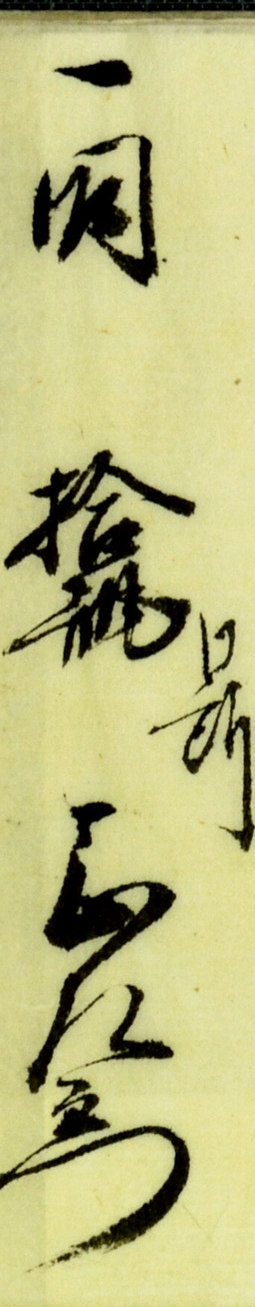一同三拾瓶平左衛門

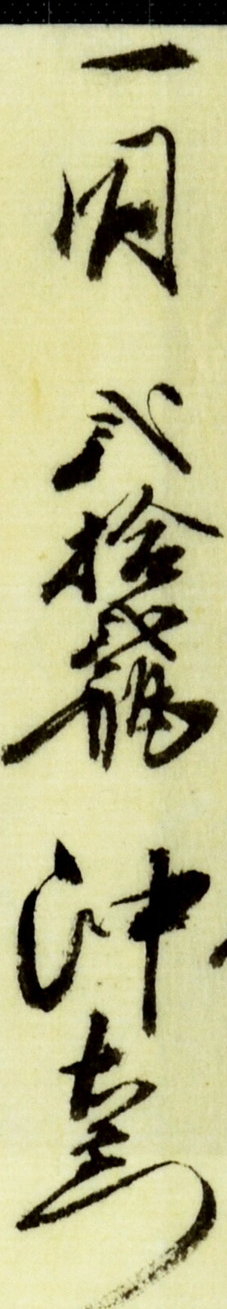一同弐拾四瓶孫右衛門
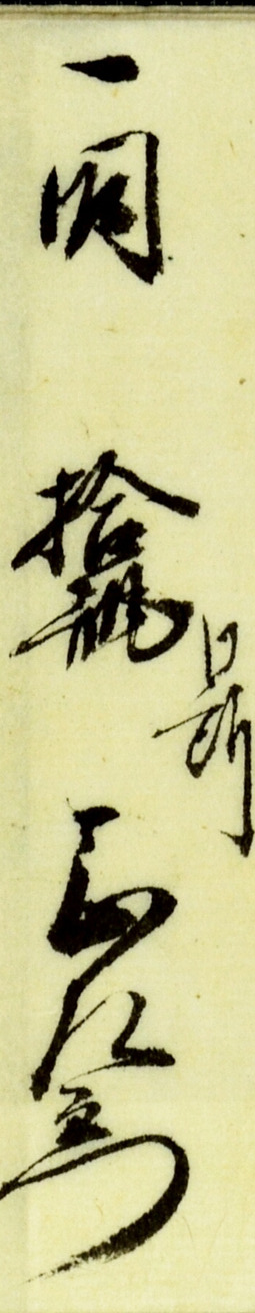一同拾瓶甚左衛門
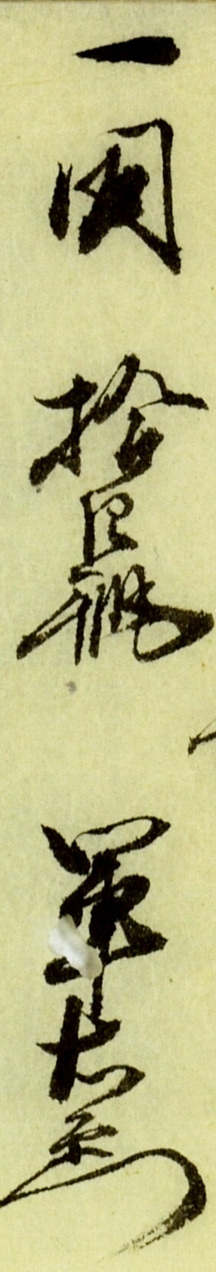一同拾四瓶軍右衛門
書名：御領分中御領分中紺屋藍瓶員数御改帳
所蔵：伊那市立高遠町図書館・合同会社AMANE
